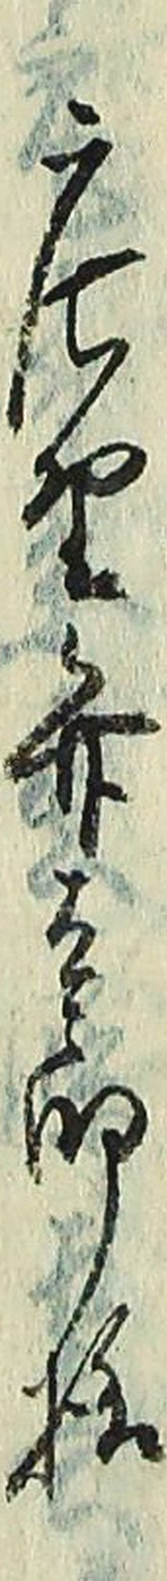庄野弁太郎様
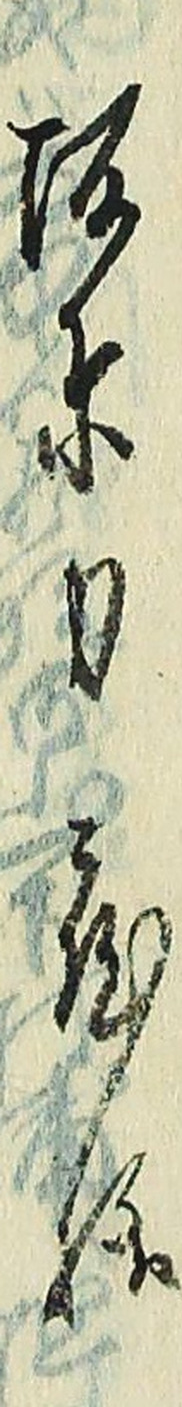坂東力蔵様
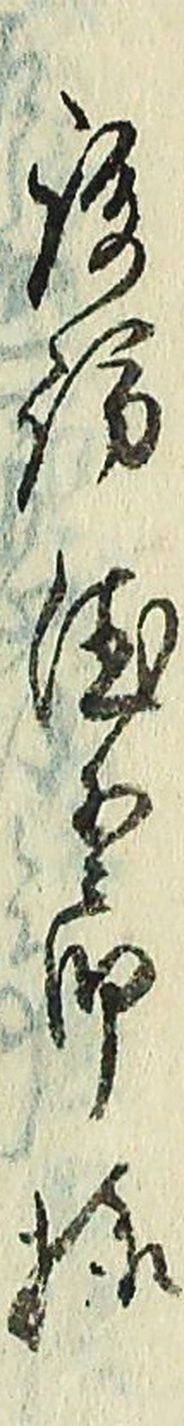諏訪徳五郎様
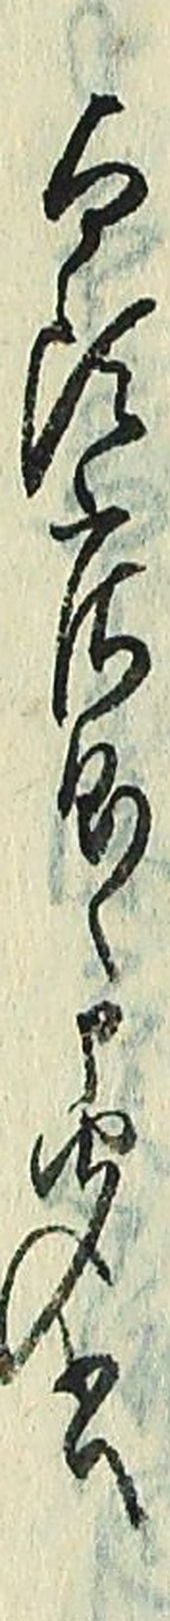与頭庄屋へ申聞書
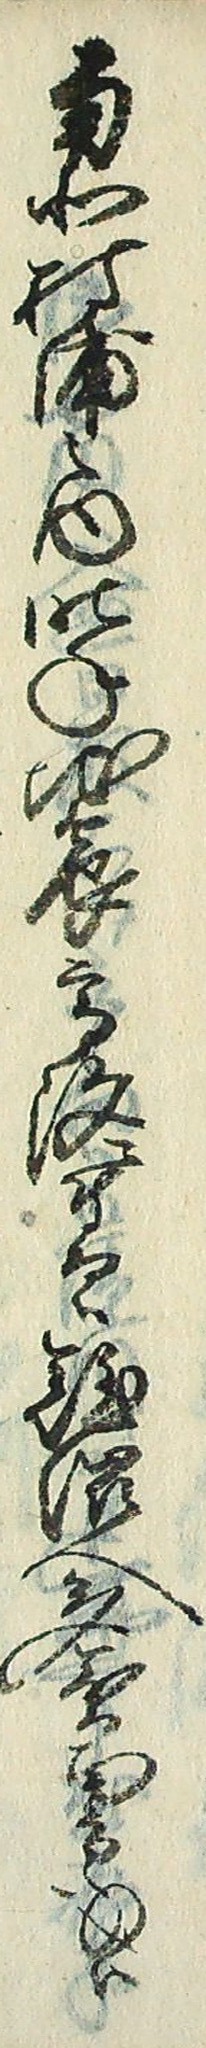南北村浦之内昨年地震高汐ニ付而ハ難渋人多暮向方之義ハ
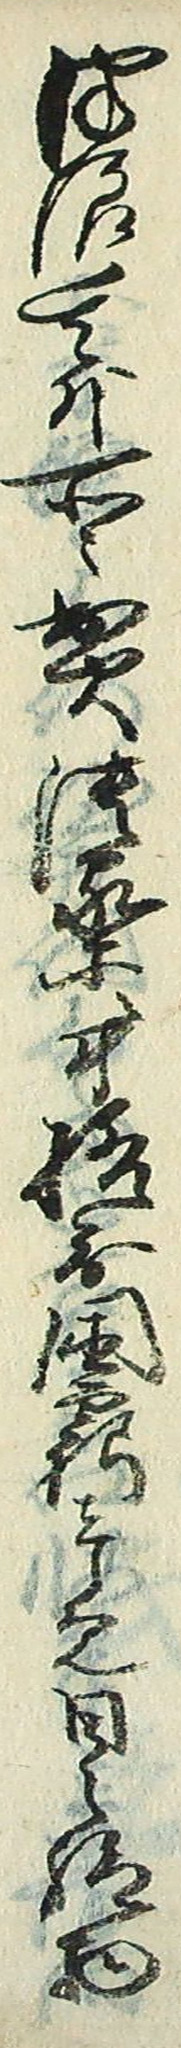津浪其外所々出火潰家等之中格別困窮せしめ日々給物
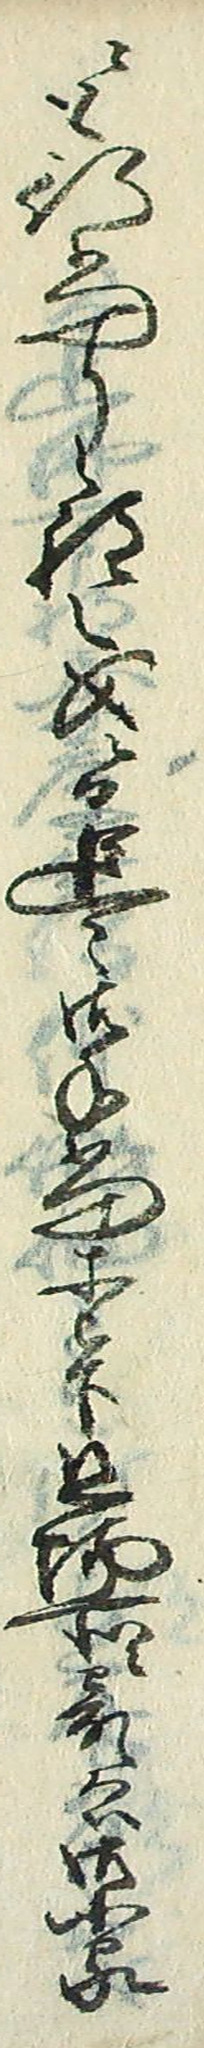ニも行當り之程之義ニ而追々御手當等被下且場所ニ寄候而ハ御小家
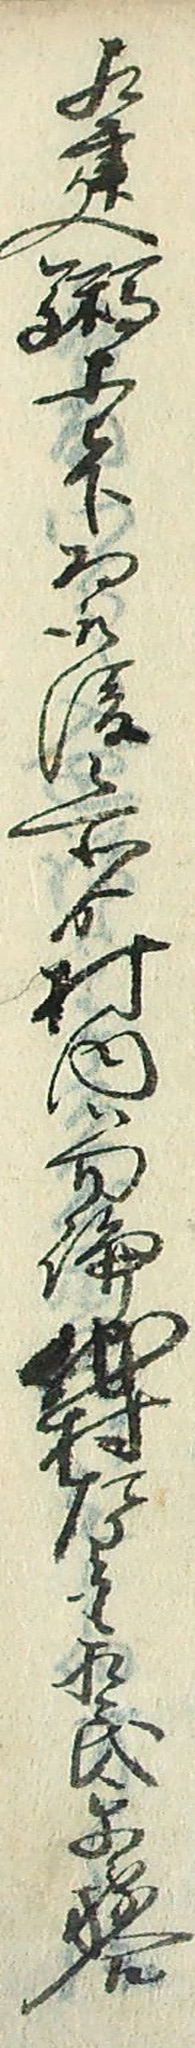相建粥等被下為取凌候所ゟ村内ハ勿論他村たりとも相民互ニ繰合

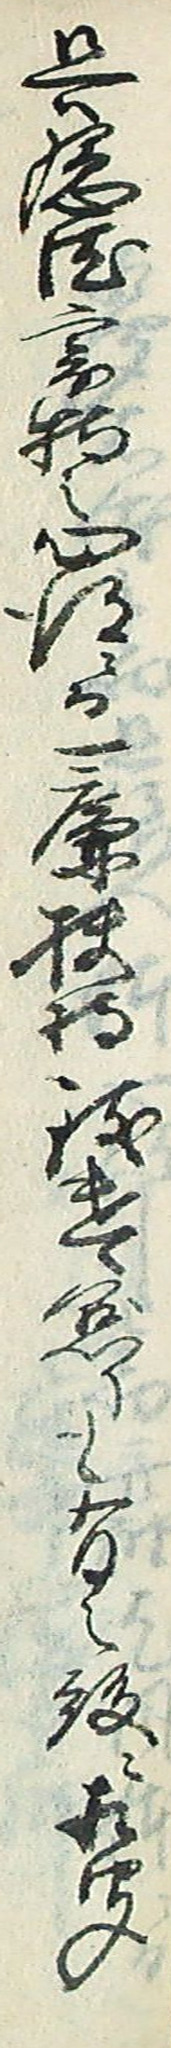且ハ隠徳寄特之心得ニ而一廉扶持致遣候懸りも有之趣ニ相聞
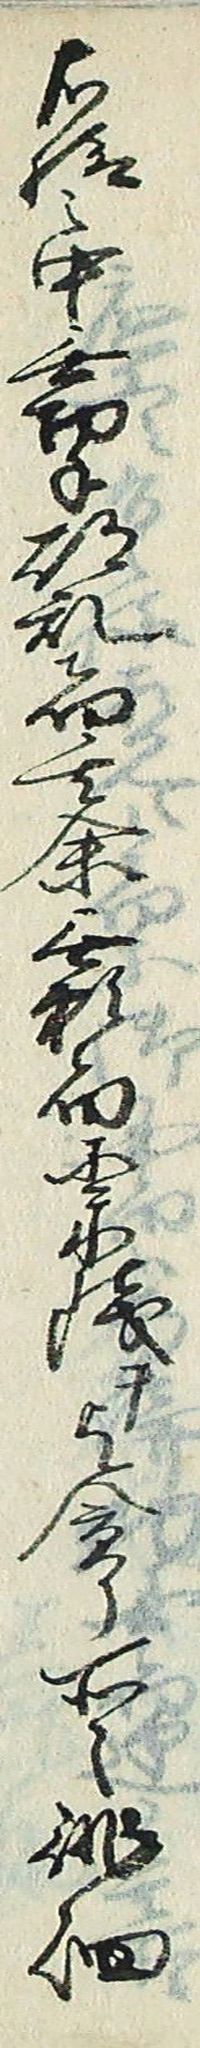右様之中無切手胡乱者其余無頼者等米銭ヲ乞貪り所々徘徊
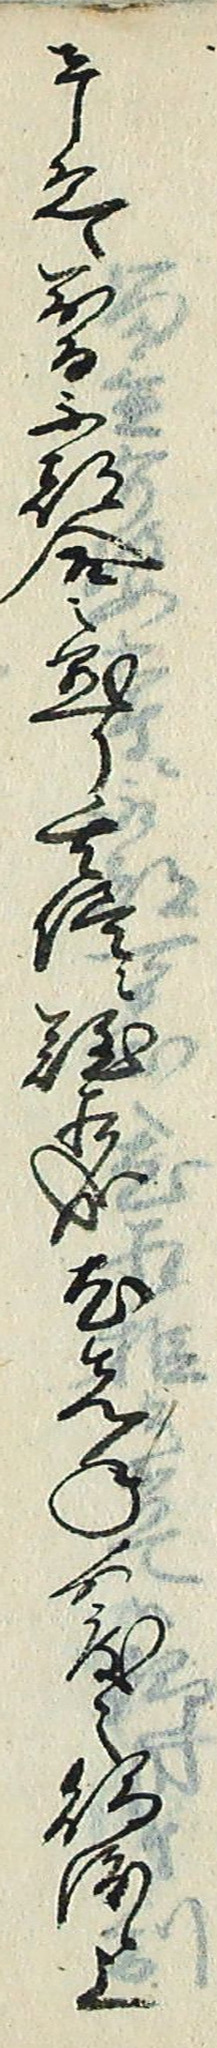せしめ候別而不都合之懸り其儘ニ難相成尤先年ゟ度々觸渡候上
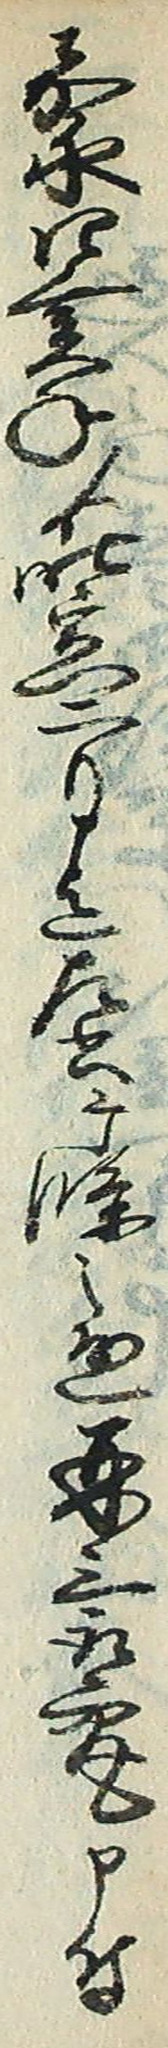嘉永四亥年ゟ昨寅二月迄左書ケ條之通再三取究申付
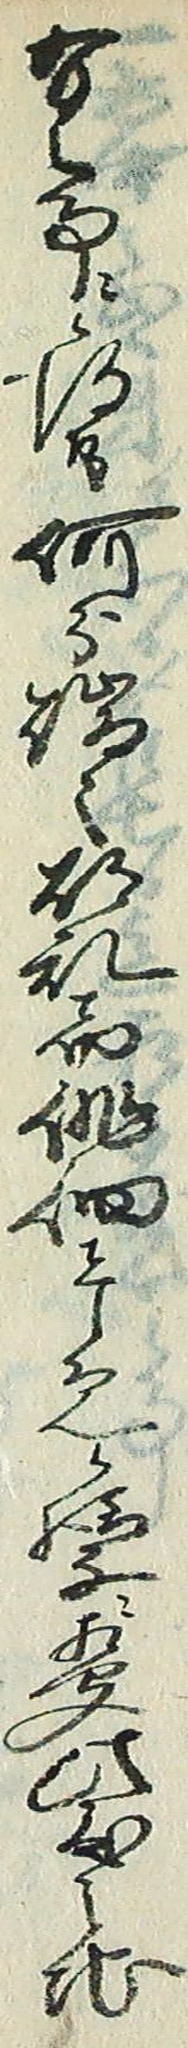有之事ニ候得共何分端々胡乱者徘徊せしめ候様子ニ相聞此度之地
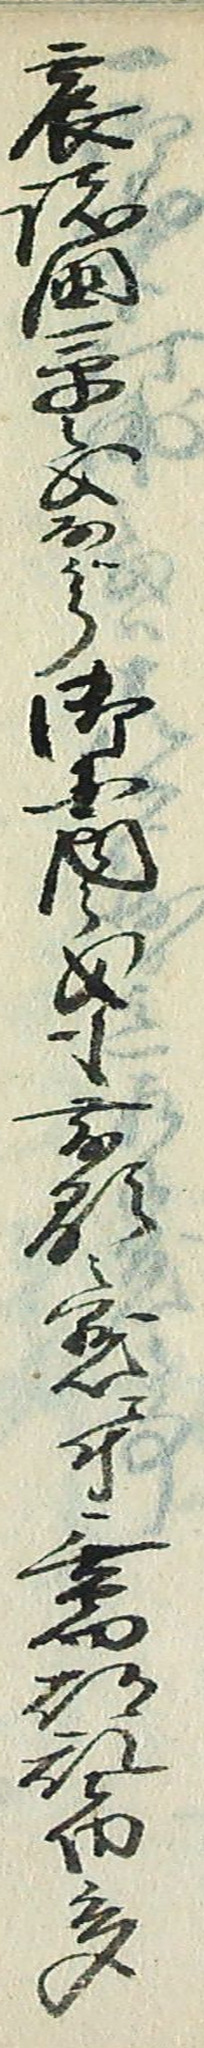震諸国互之義ながら御国内之義も前顕之懸ニ付無宿胡乱者多
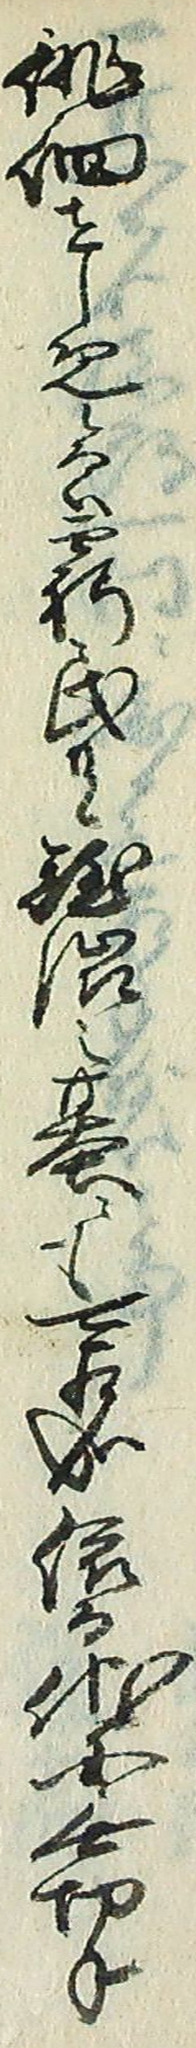徘徊せしめ候而ハ窮民共難渋之基ニも可相成依而他国無切手
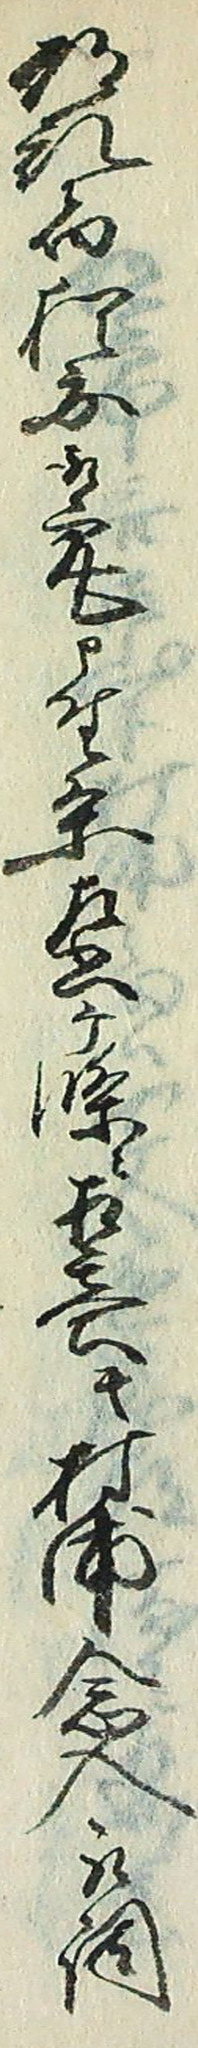胡乱者猶亦取究申付候条左書ケ條ニ相基キ村浦念入取調
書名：諸御趣意書并御下知向之写
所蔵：鳴門教育大学 Naruto University of Education
